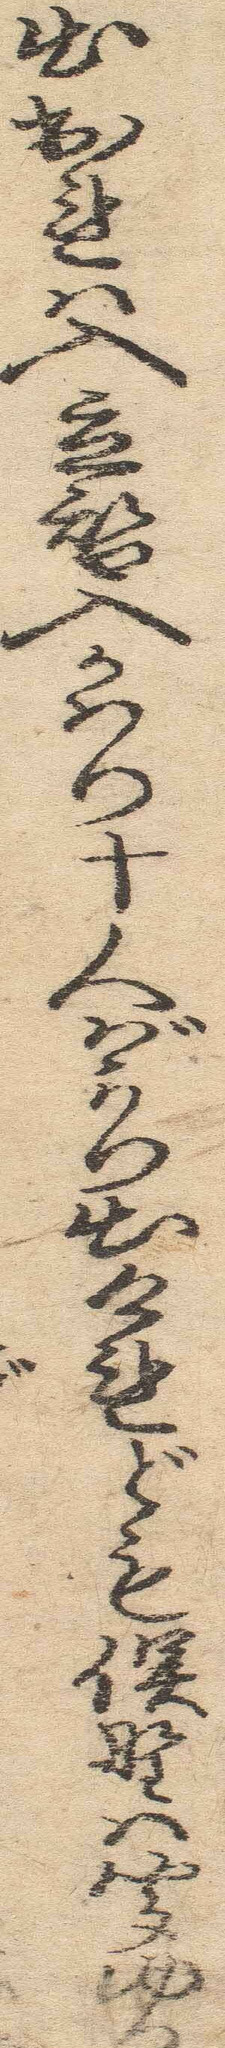出おれは入立替入かはり十人ばかり出けれども俣野は聞ゆる
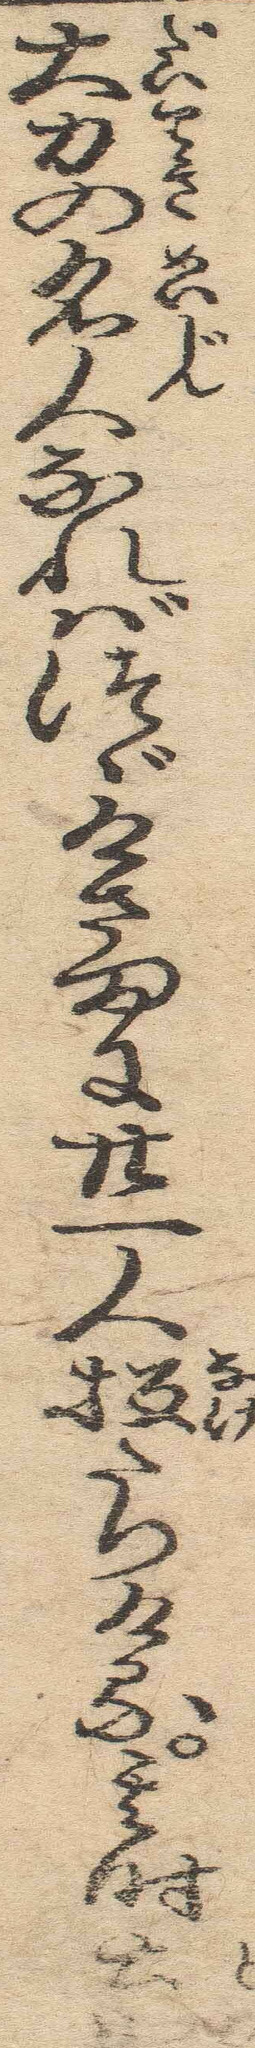大力の名人なればつゞけさまに廿一人投たりける。其時土肥
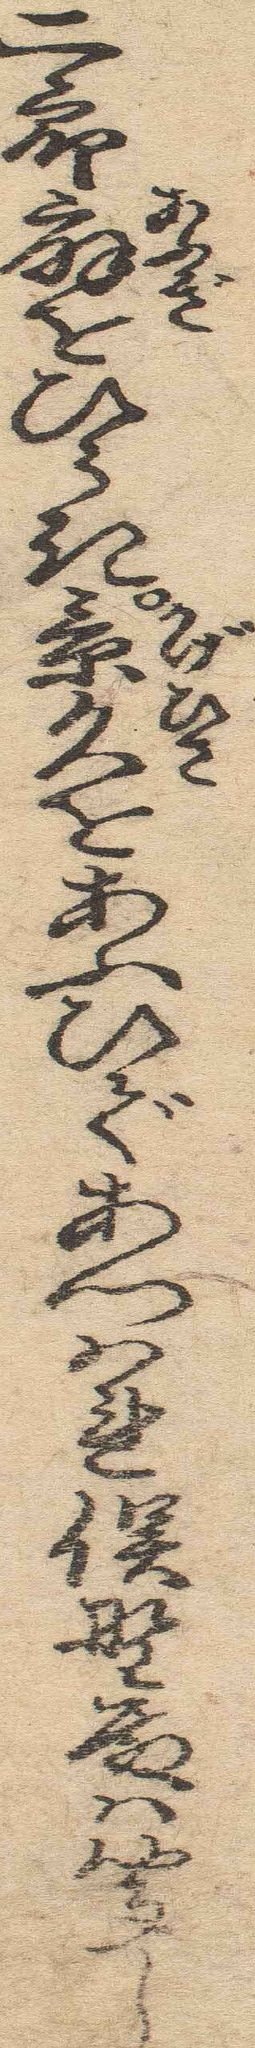二郎扇をひらき。景久をあふひであつはれ俣野殿は聞し
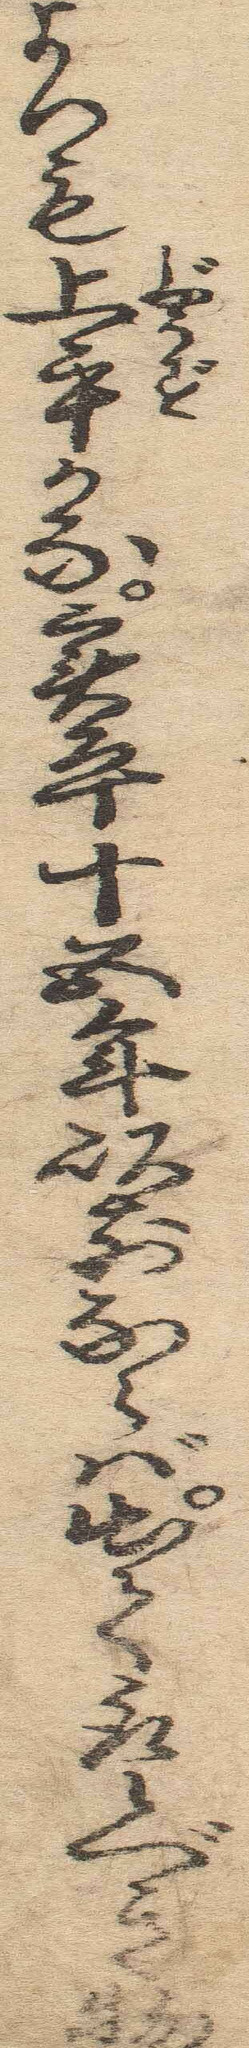よりも上手かな。實平十五年以前ならば。出て取候べき物
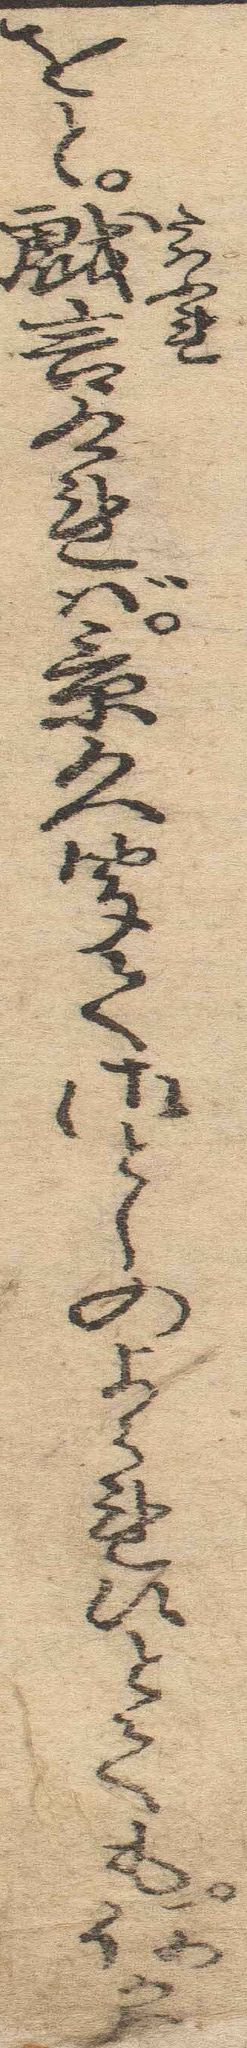をと。戯言ければ。景久聞て御としのよられ候とても。何かは
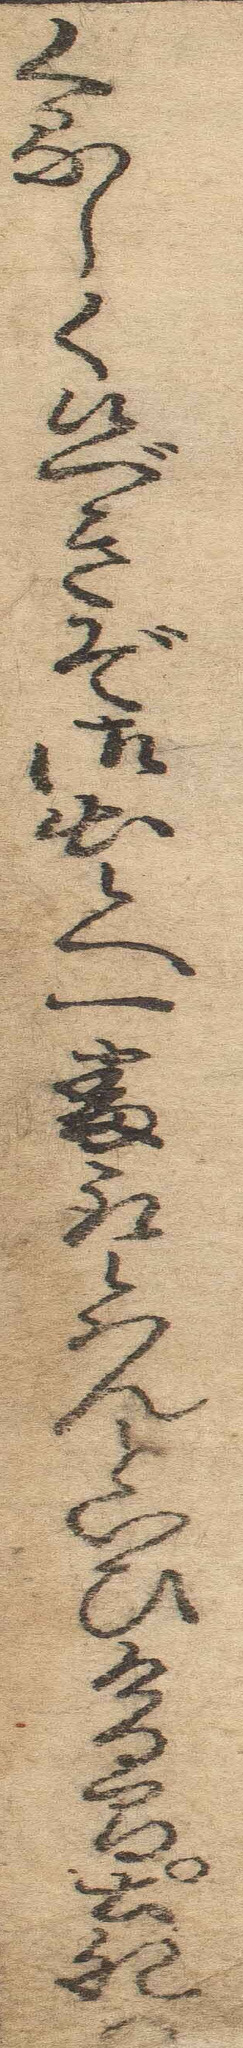くるしく候べきぞ御出候へ一番取候はんといひける間。土肥は

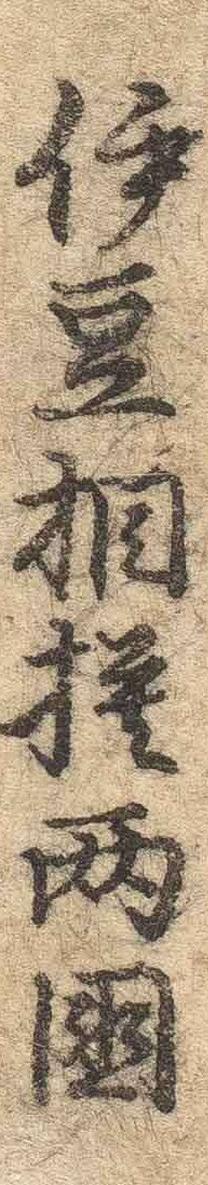伊豆相模両国
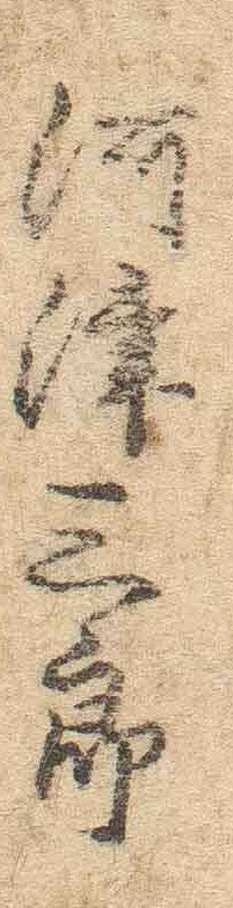河津三郎
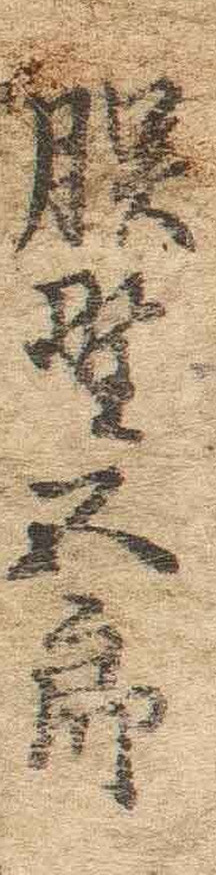脵野五郎

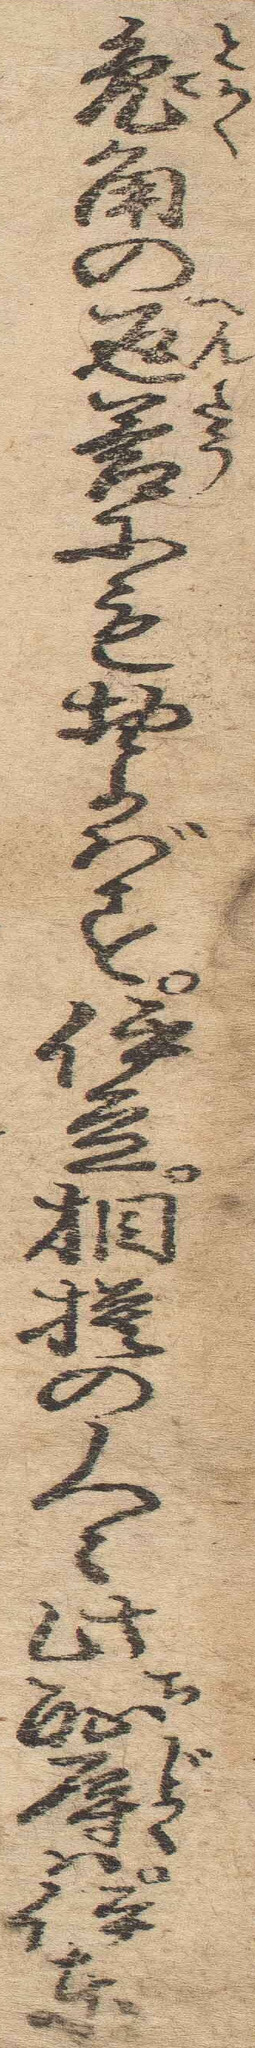兎角の返答にもおよばず。伊豆。相模の人々此恥辱は。伊東
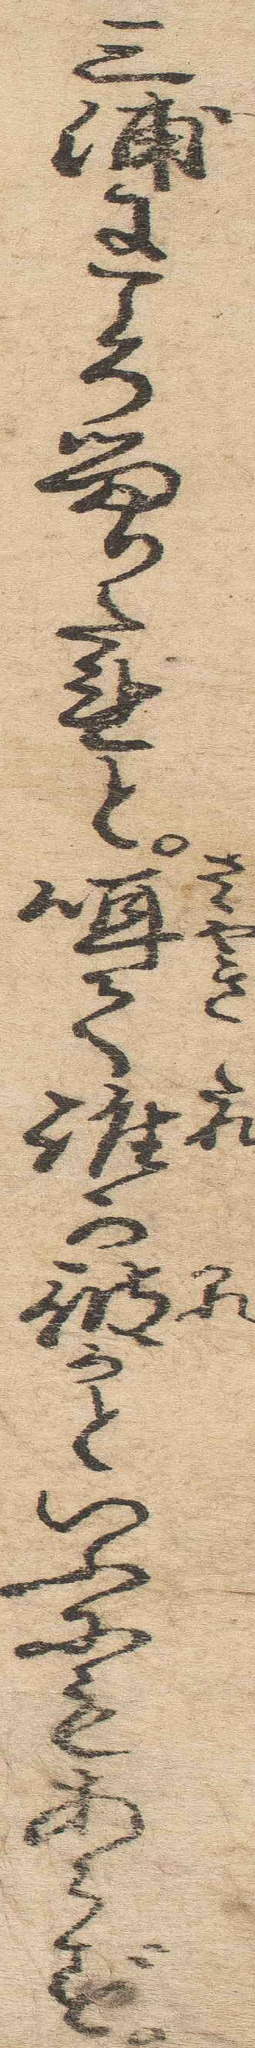三浦にこそ留りたれと。囁て誰か彼かといふにもあらず。
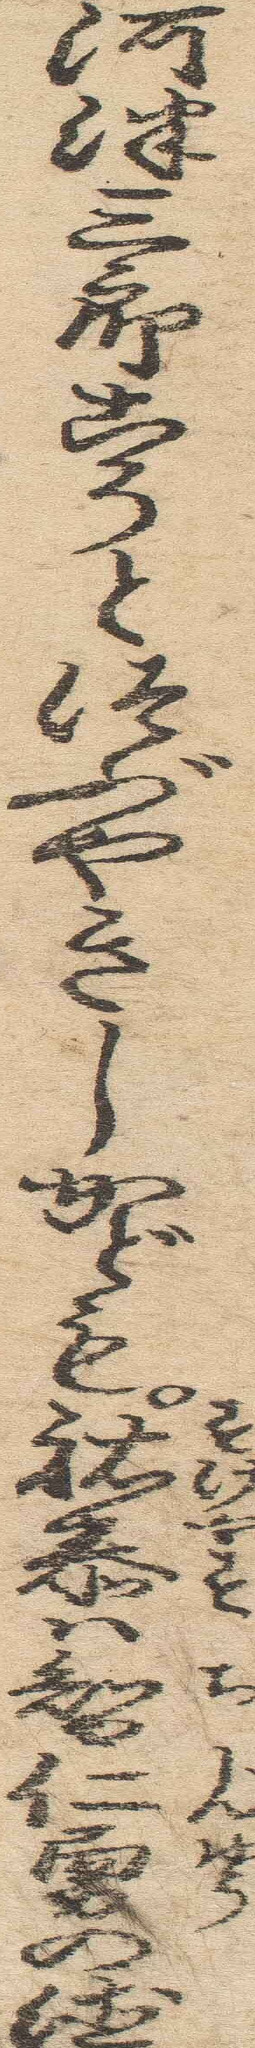河津三郎こそとつぶやきしかども。祐泰は智仁勇の徳
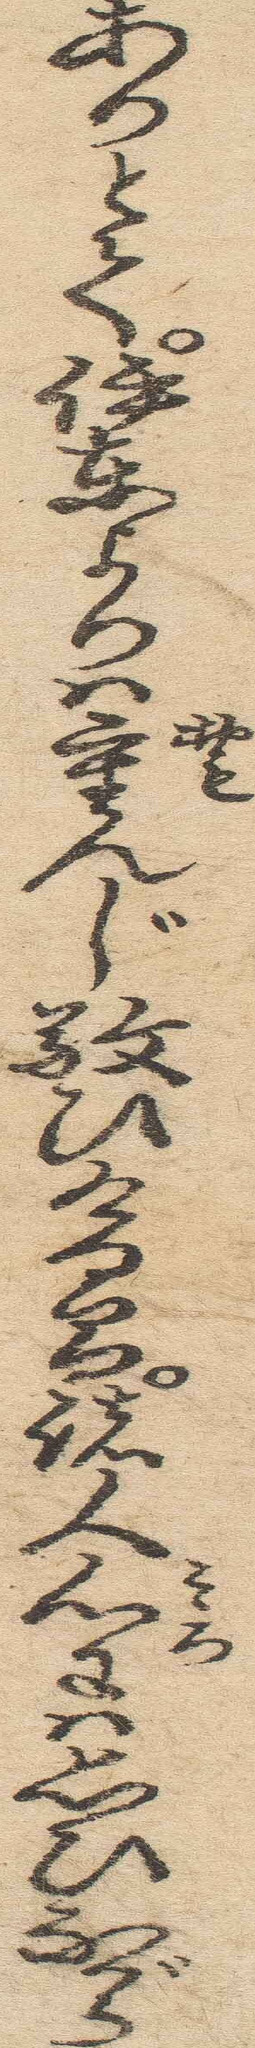ありとて。伊東よりは重んじ敬ひける間。諸人心には思ひながら
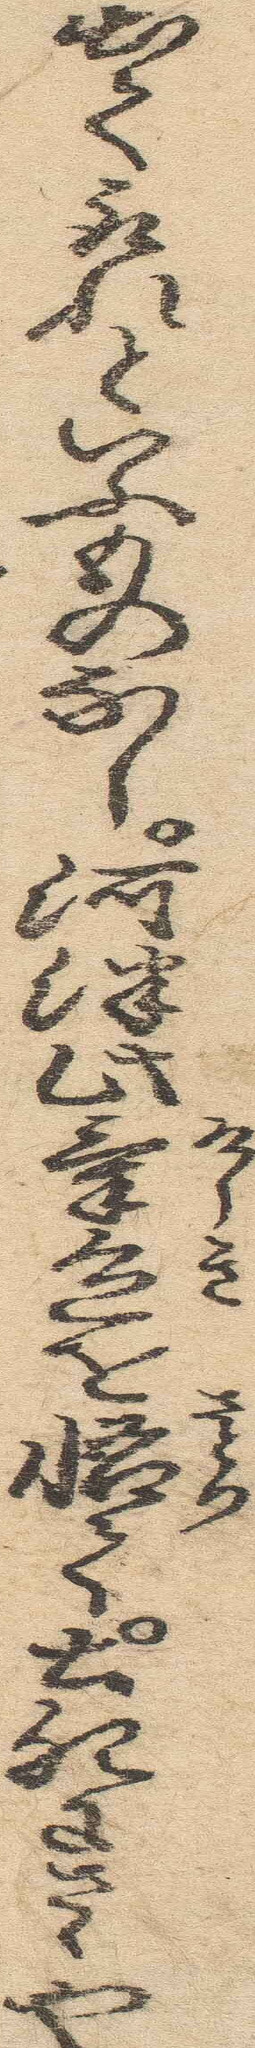出て取れといふものなし。河津氏景色を悟て。土肥にさゝや
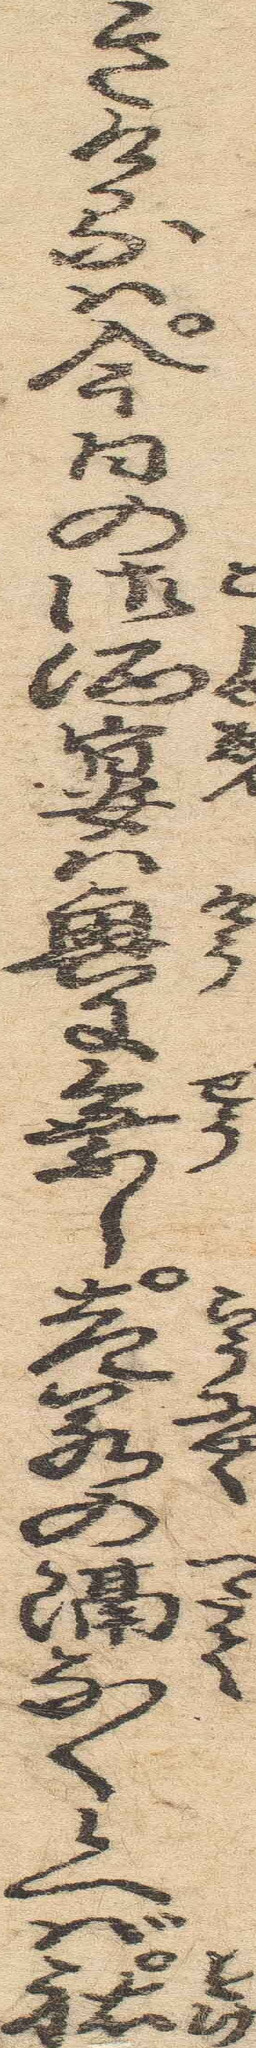きけるは。今日の御酒宴は興に乗じ。老若の隔なく候はば。祐
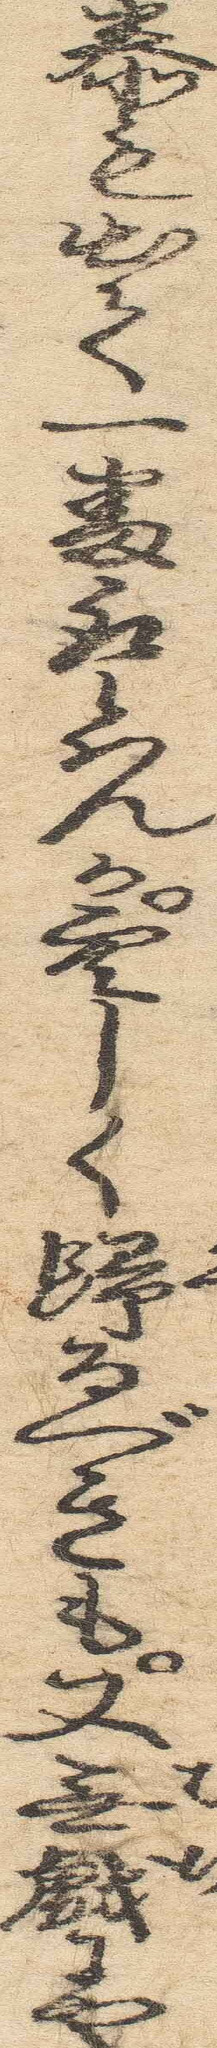泰も出て一番取候はんか。空しく帰るべきも。又無戯にや
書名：古今相撲大全
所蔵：東京学芸大学附属図書館 国文学研究資料館
